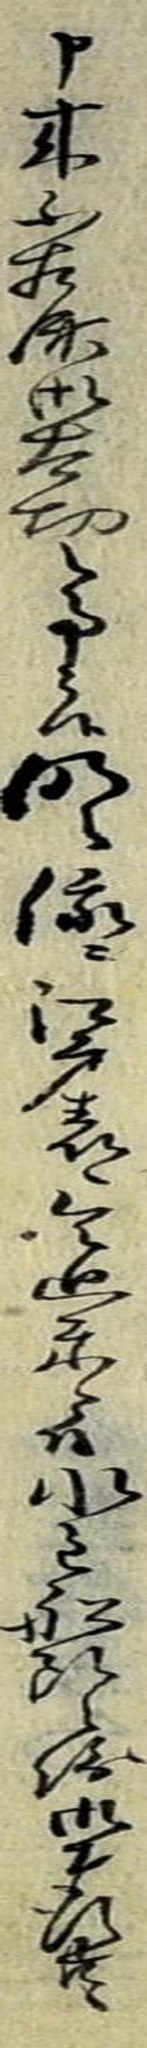申来不相済御太切之事に候仍之俄に江戸表へ令廻米候に付水主船頭之儀御奉行共へ
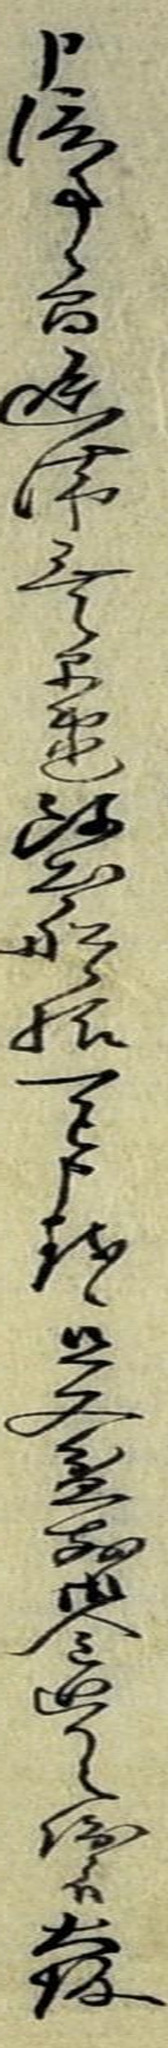申渡事候間遅滞無之早速致出船候様可被申越候且又盆前御金廻り之儀に付大坂
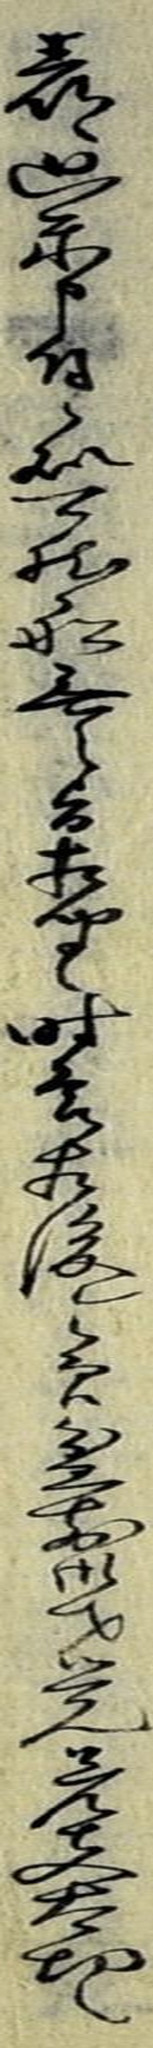表へ廻米申付之処可然船無之旨相聞候時節相後れ候而は盆前御才覚差支太切之
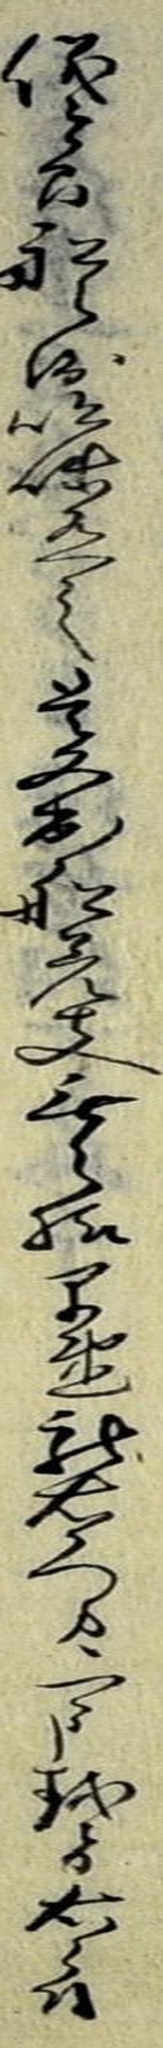儀に候間船之儀吟味有之是又出船差支無之様早速新右衛門方へ可申越旨右に付
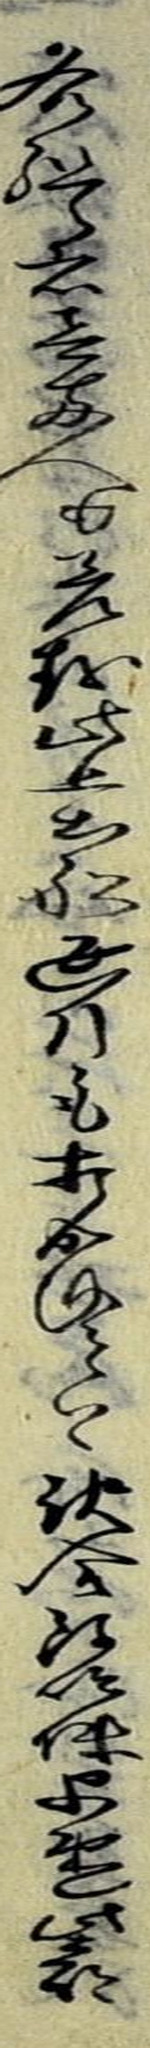各組之者壱両人も差越此上出船延引にも相成趣に候はゝ訳合致吟味早速此表へ
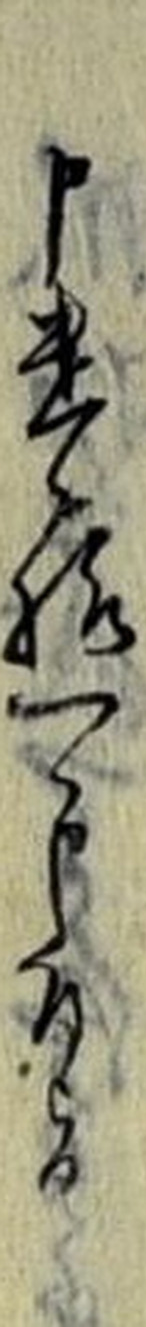申遣候様可申付旨
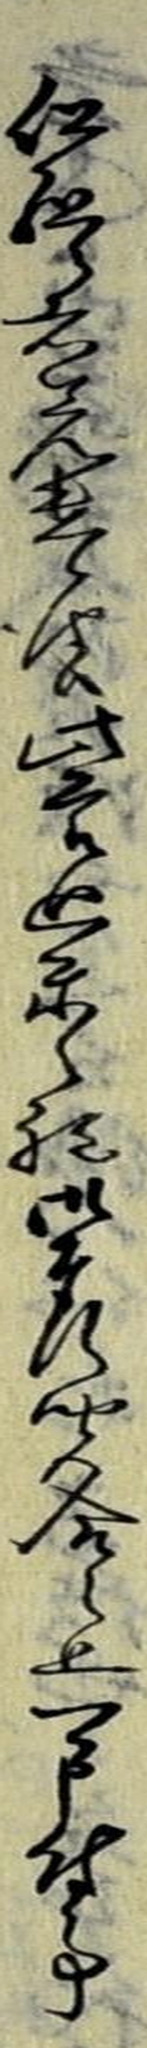但組之者差遣候儀は此節廻米之程御奉行聞合之上可申付事
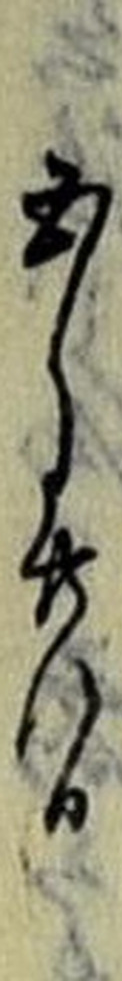五月廿八日
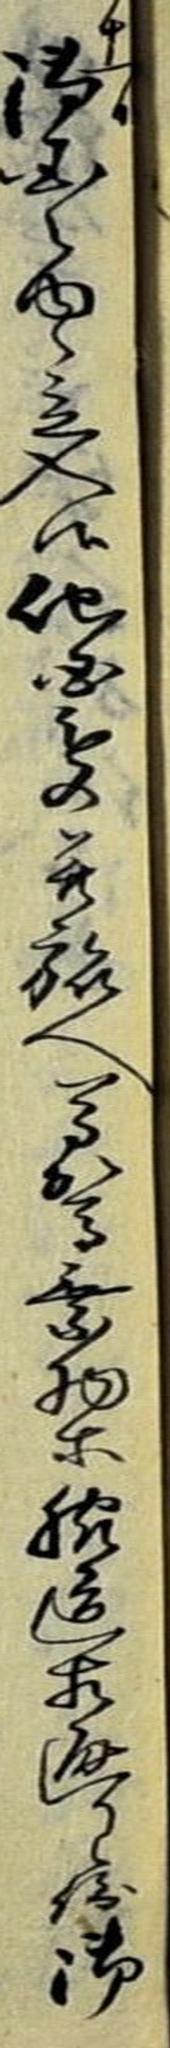御国之内へ立入候他国もの并旅人馬駕乗物等脇道相通り候儀御
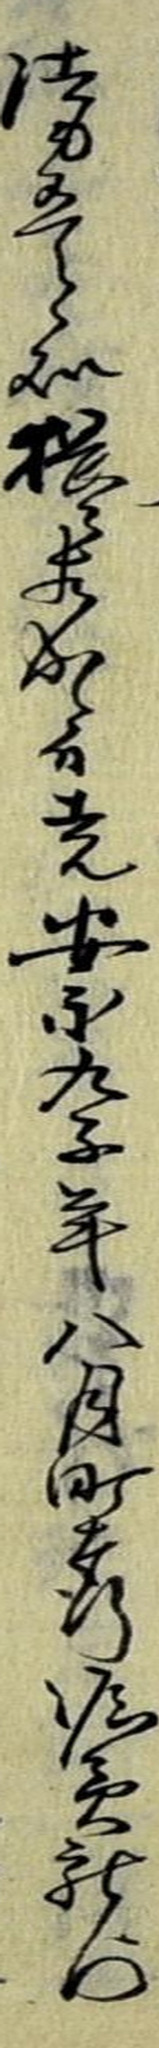法も有之候処猥に相成候に付去る安永九子年八月町奉行渥美新右衛門
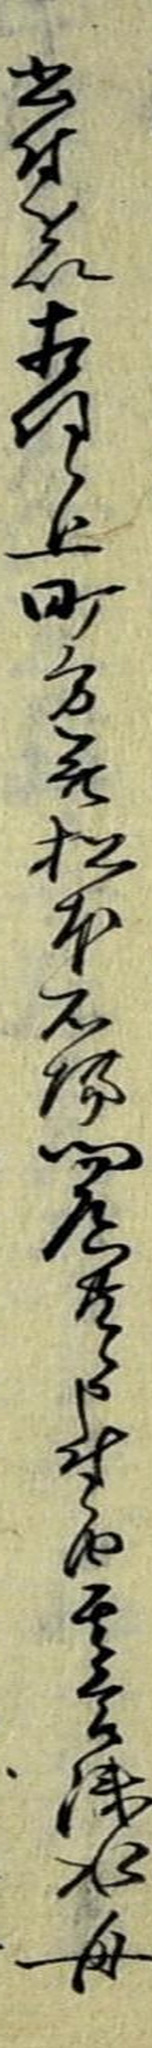書付を以相伺候上町方并松本石場問屋共へ申付候由其節浅水舟
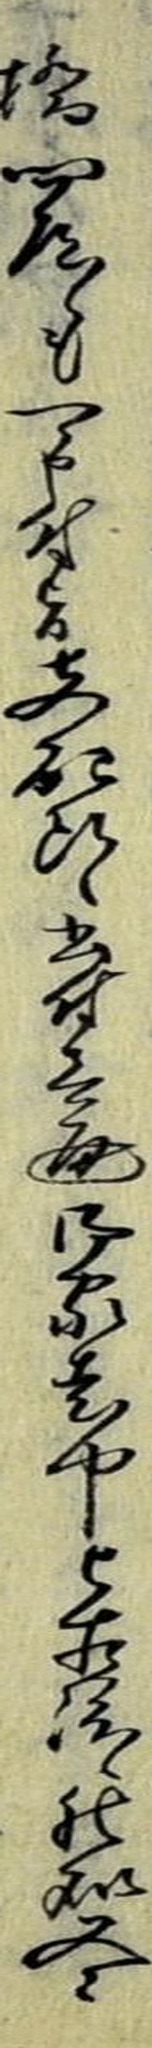橋問屋へも可申付旨支配頭へ書付壱通御家老中被相渡候然処又々
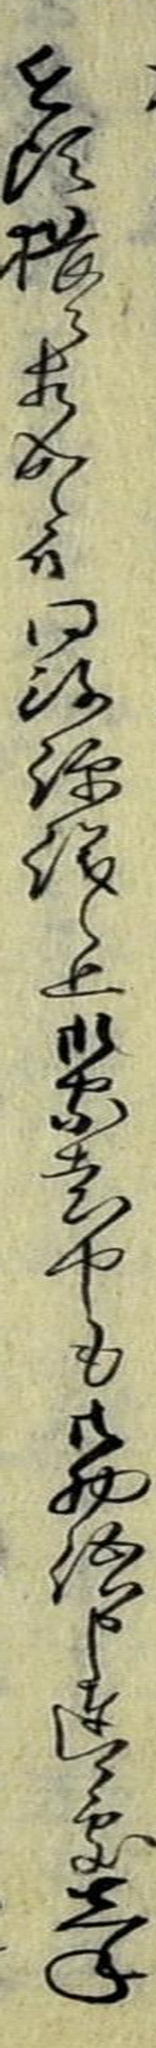近頃猥に相成候に付同役評議之上御家老中へも御物語申達候処先年
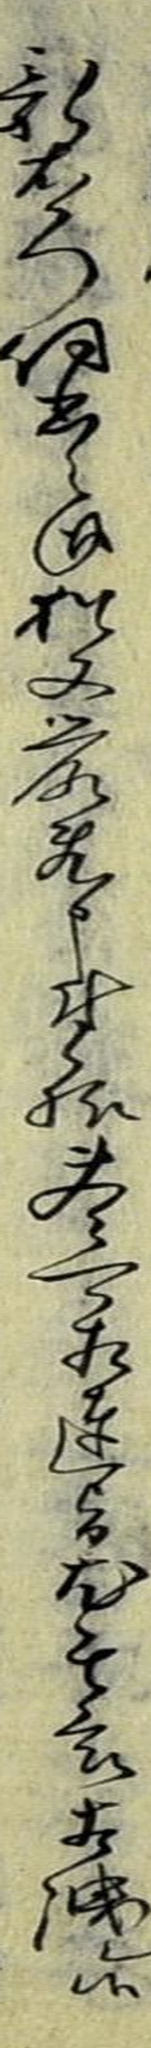新右衛門伺書之趣猶又厳敷申付候様夫々可相達旨尤其節相洩れ候
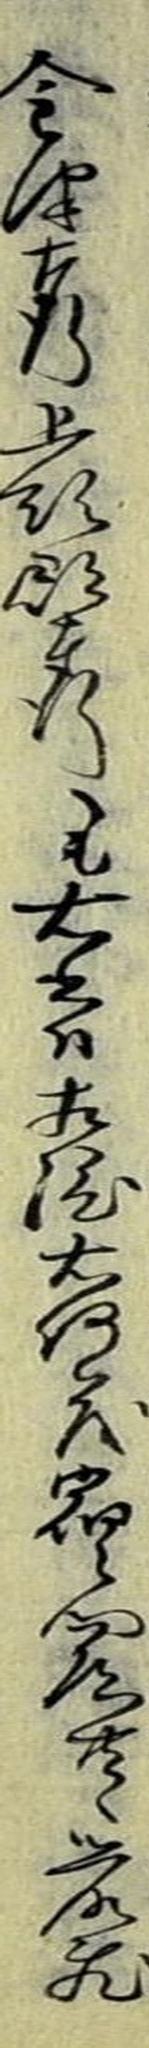金津奉行上領郡奉行へも右書付相渡右何茂宿々問屋共へ厳敷
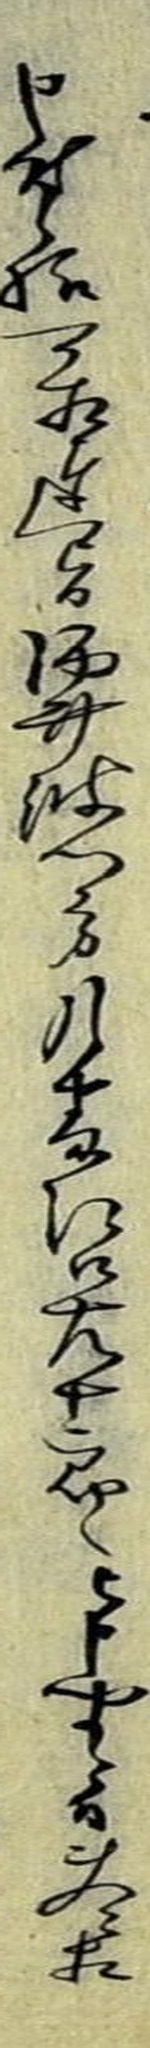申付候様可相達旨酒井波門方月番江口左十郎へ被申聞候に付夫々相
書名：命令之部 二
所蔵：福井県文書館 Fukui Prefectural Archives
